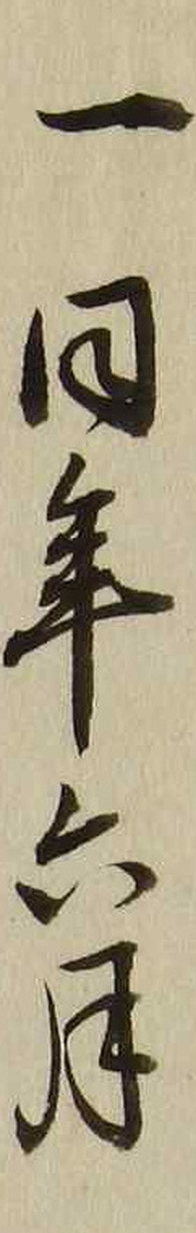一同年六月
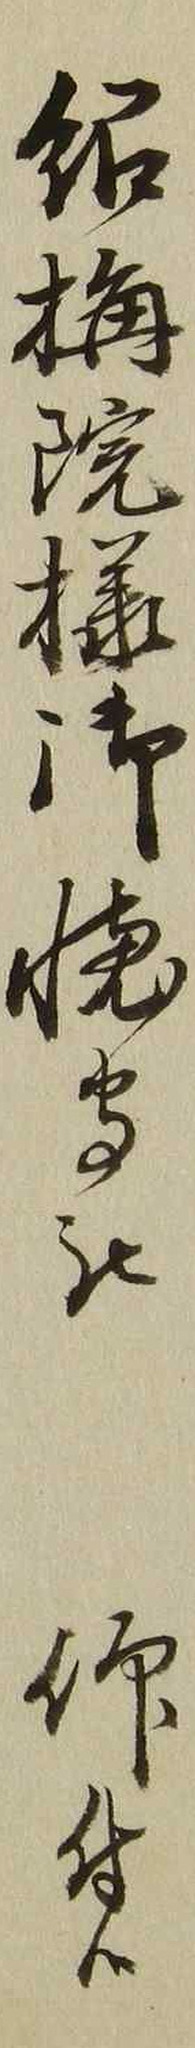紹栴院様御懐守被仰付候
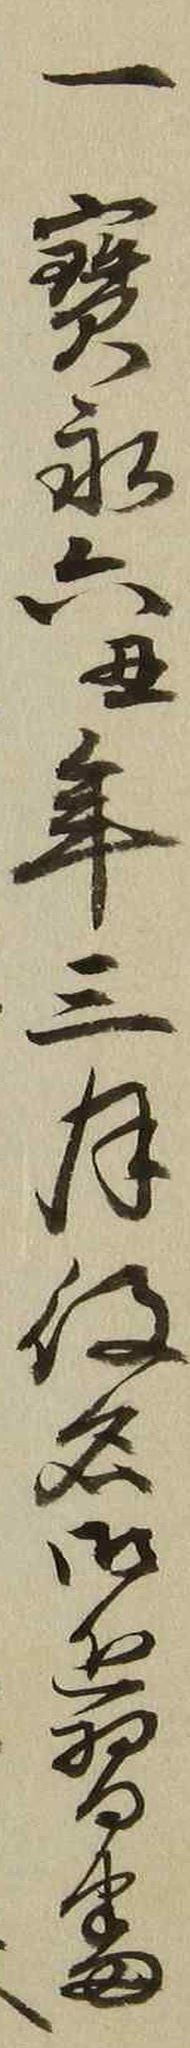一宝永六丑年三月役名御近習番
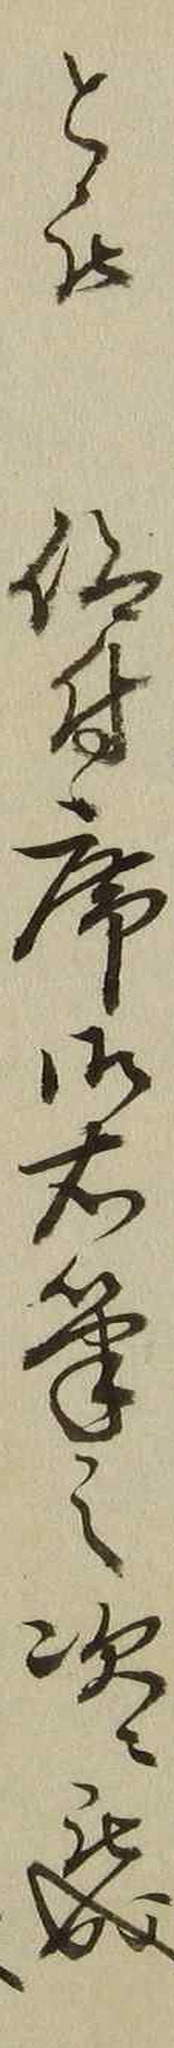と被仰付席御右筆之次ニ被成
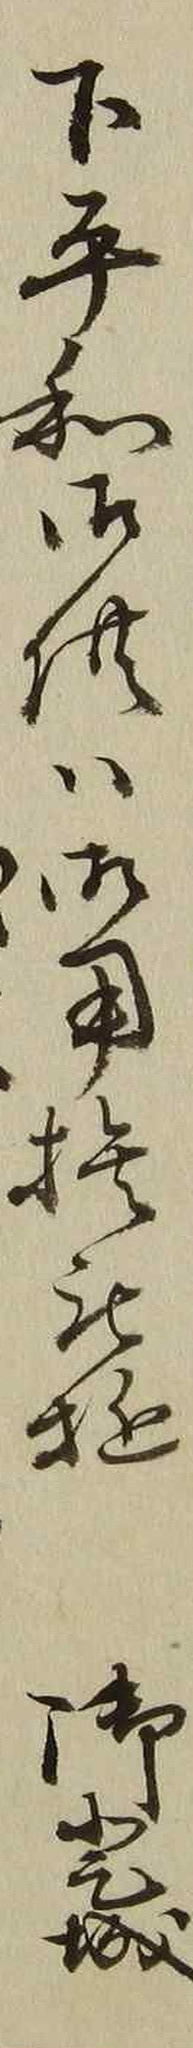下平和御供ハ御用捨被遊御登城
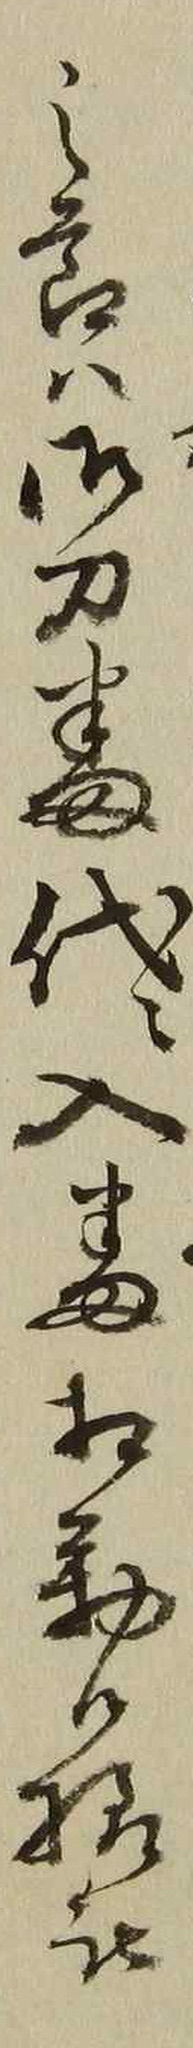之節ハ御刀番代ニ入番相勤候様被
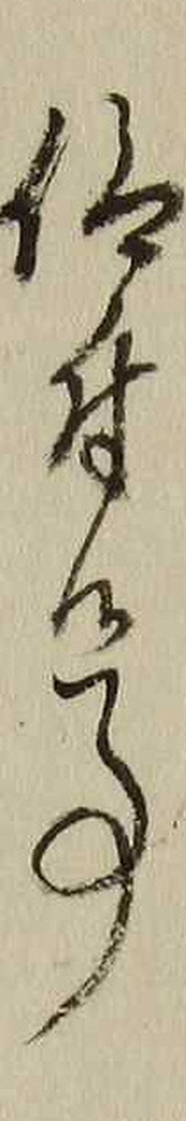仰付候事
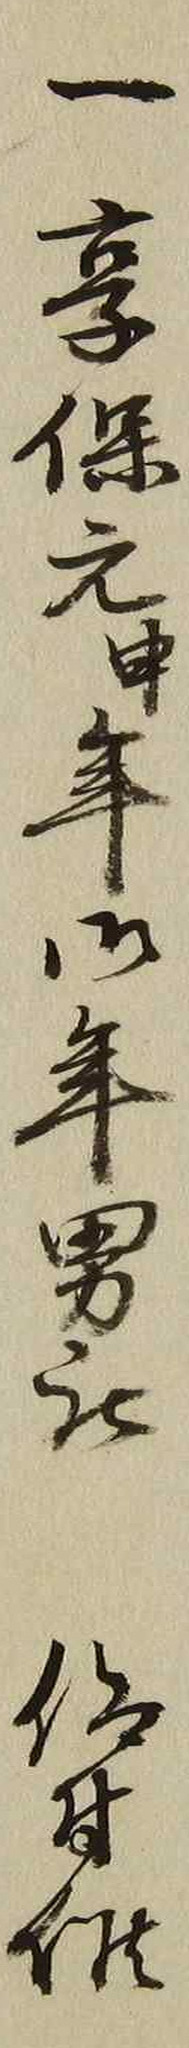一享保元申年御年男被仰付候
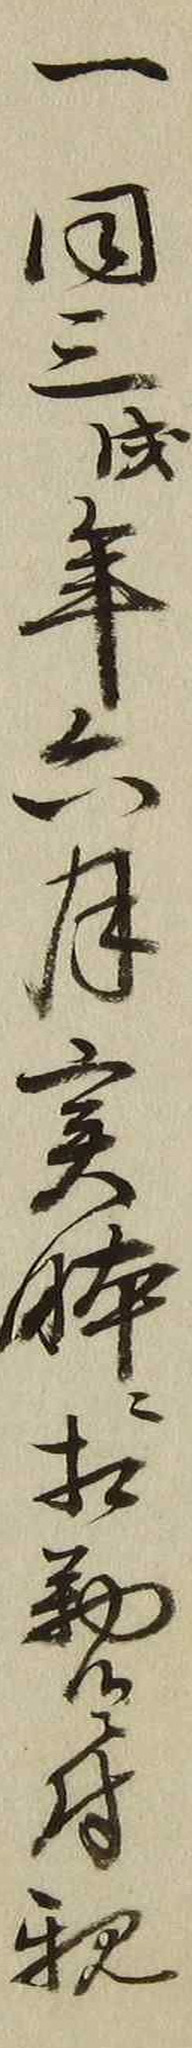一同三戌年六月実体ニ相勤候ニ付親
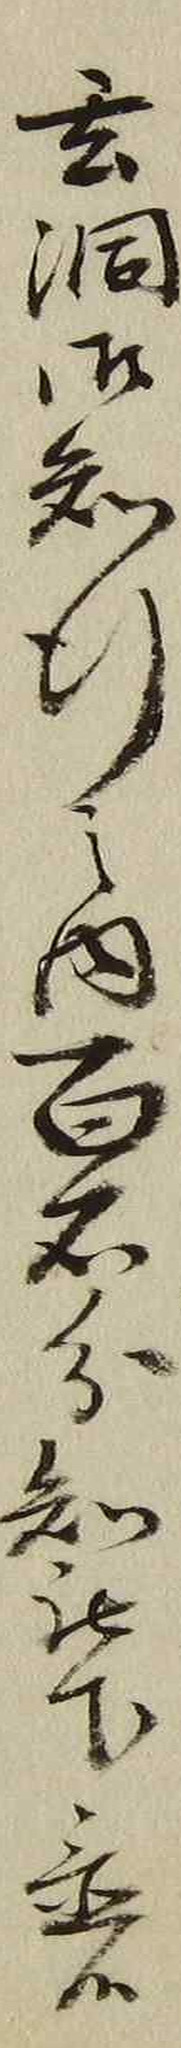玄洞御知行之内百石分知被下置候
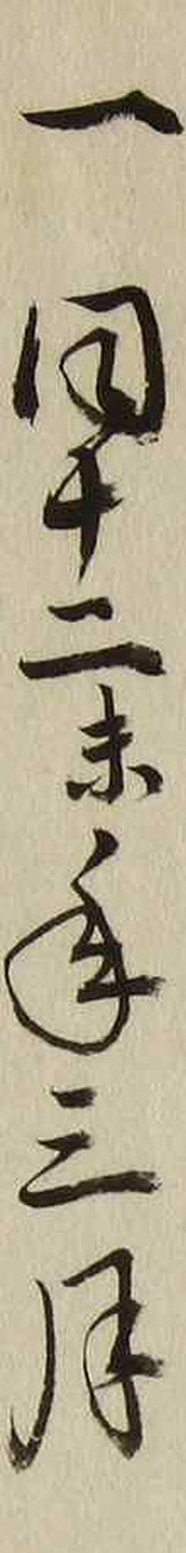一同十二未年三月
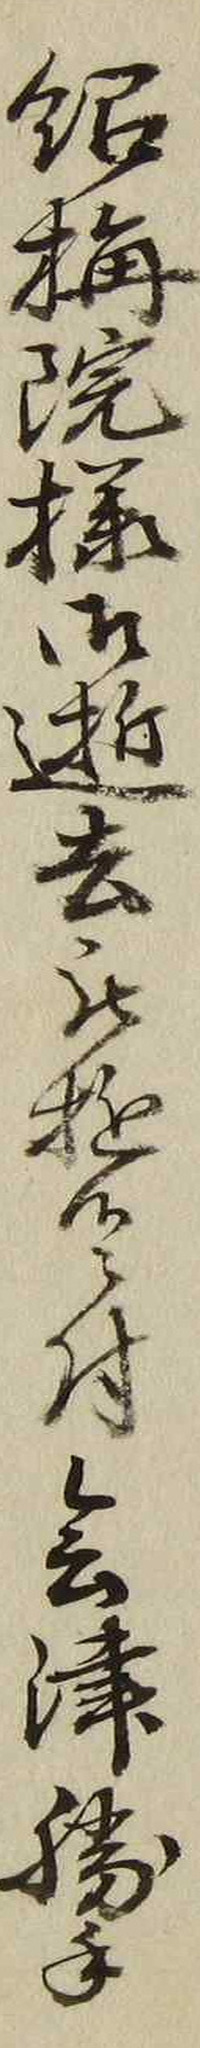紹栴院様御逝去被遊候ニ付会津勝手
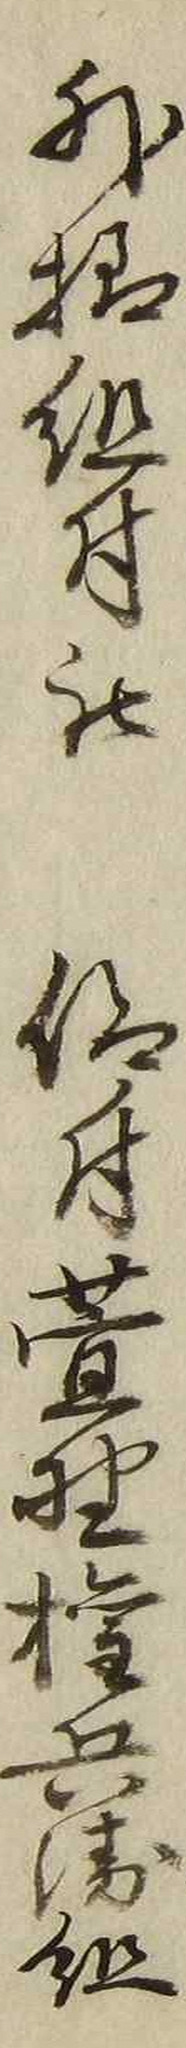外様組付被仰付萱野権兵衛組
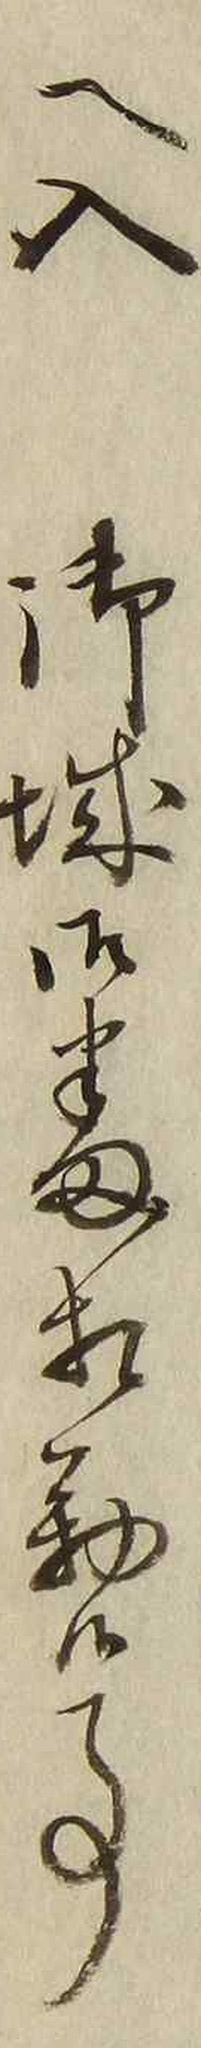へ入御城御番相勤候事

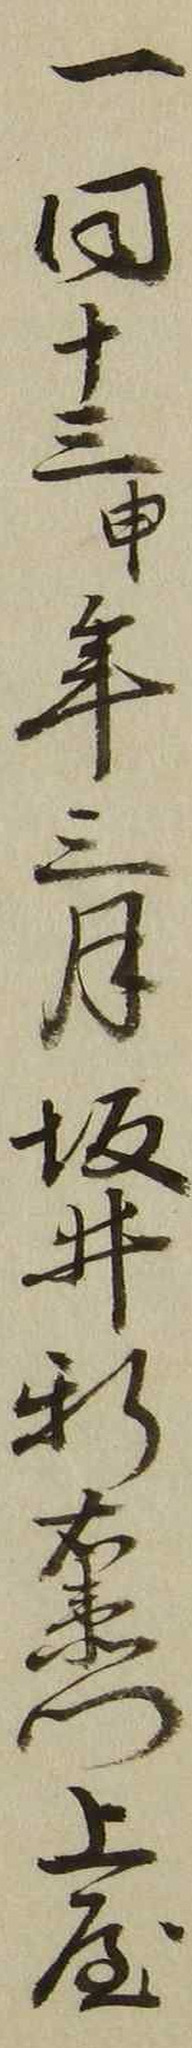一同十三申年三月坂井新右衛門上屋
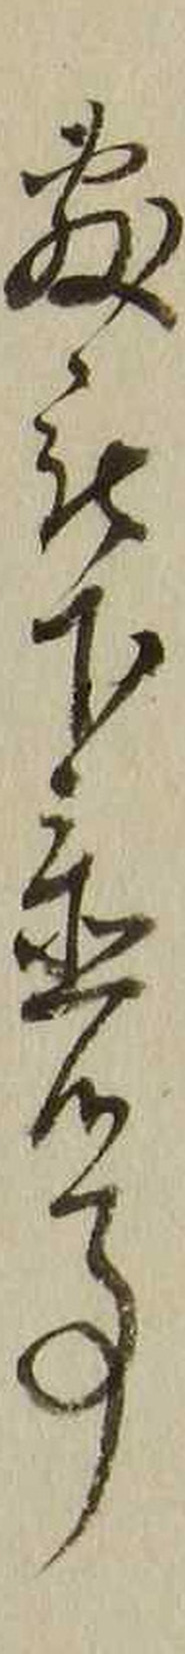敷被下置候事
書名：諸士系譜　巻之35　は之部3
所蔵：会津若松市立会津図書館
